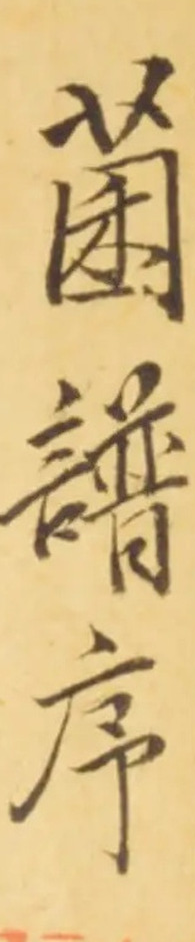菌譜序
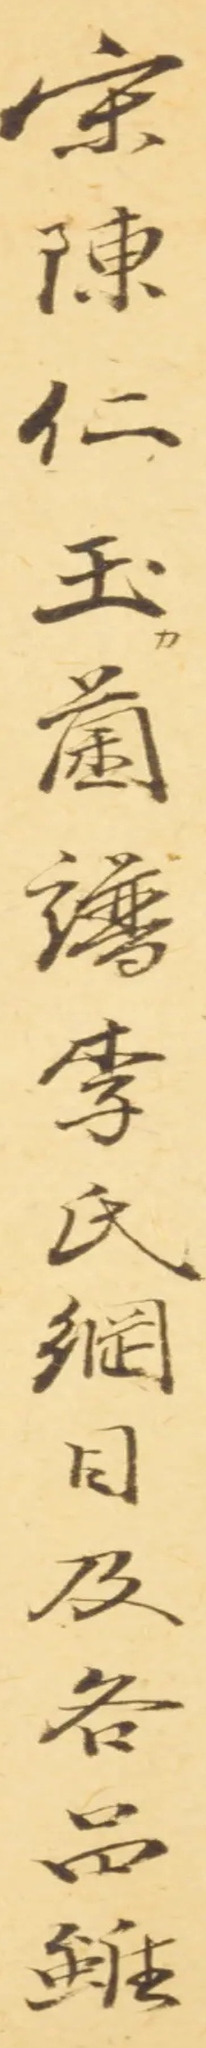宋陳仁玉菌譜李氏網目及各品雖
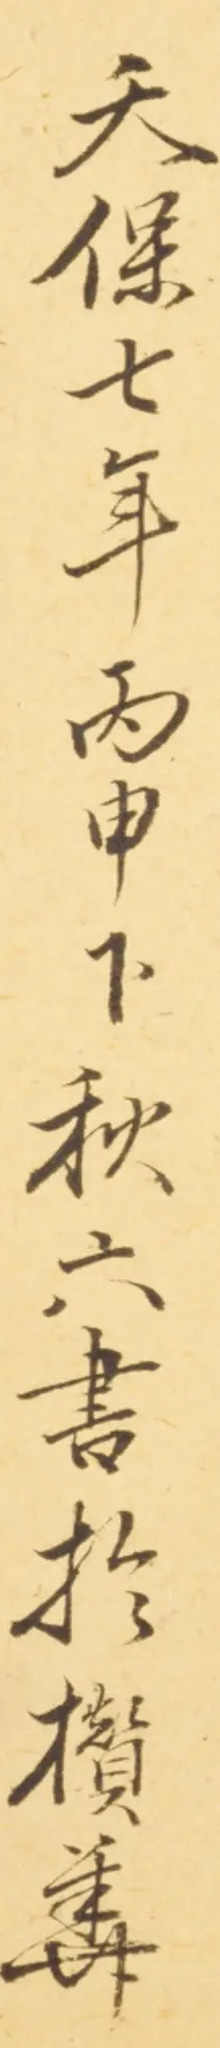天保七年丙申下秋六書於欑華
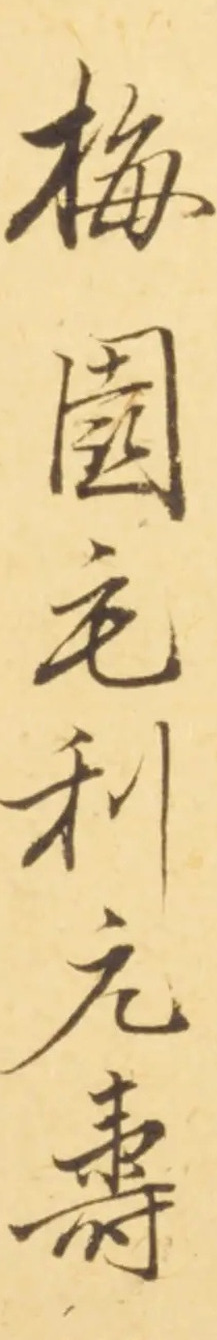梅園毛利元壽
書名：梅園菌譜
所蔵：国立国会図書館 National Diet Library, JAPAN
